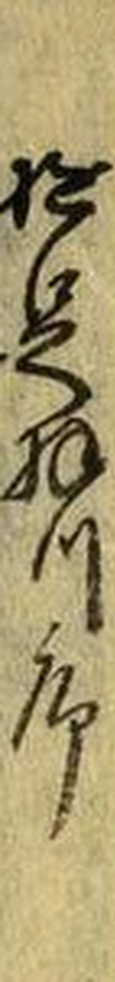遊足羽川序
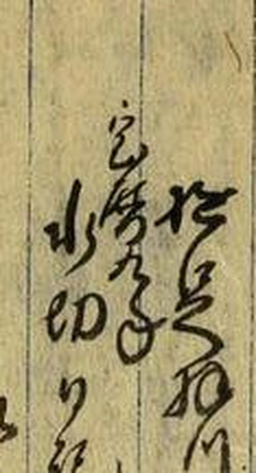宝暦九年
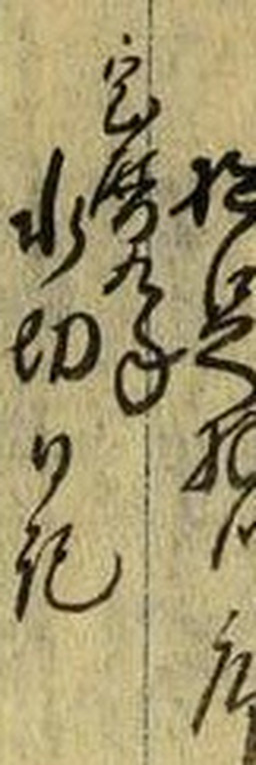水切日記
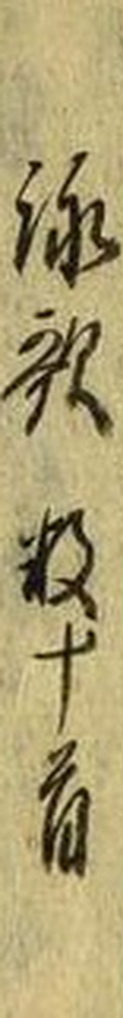詠歌数十種
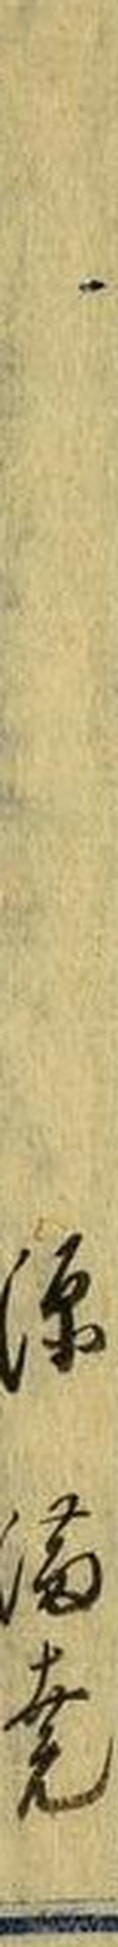源満尭
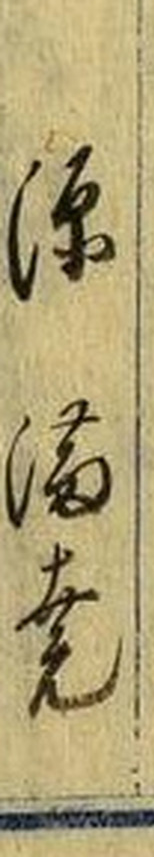源満尭
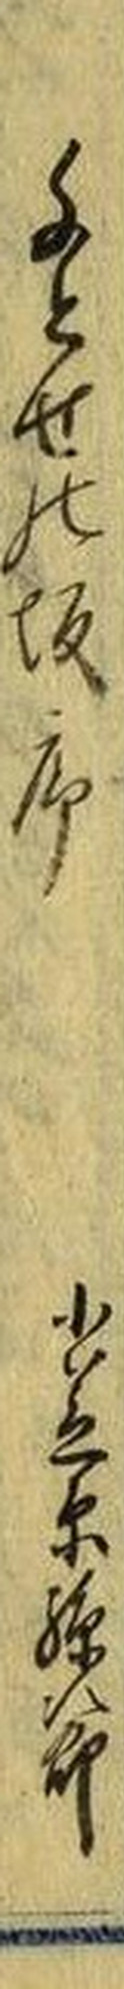ちとせの坂序小笠原孫次郎
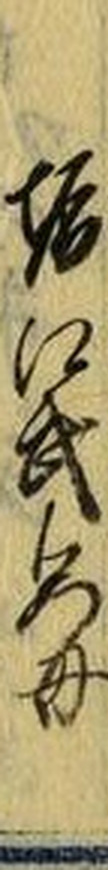堀江武右衛門母
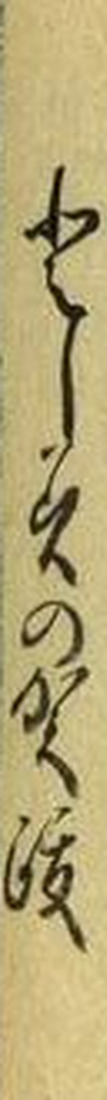としみの賀跋
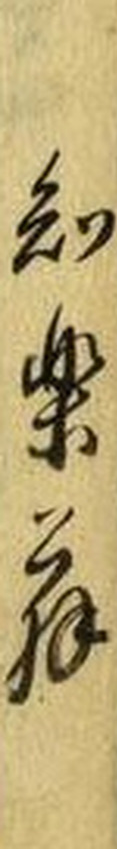知楽翁
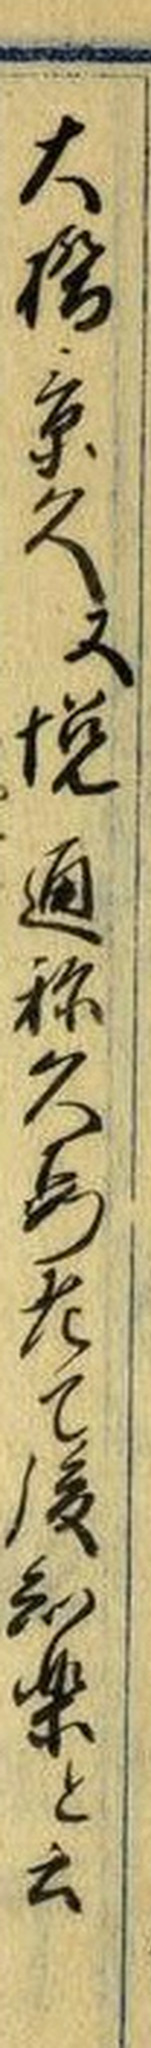大橋景久又悦通称久右衛門老て後知楽と云
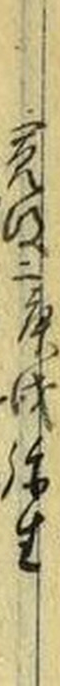寛政二庚戌弥生
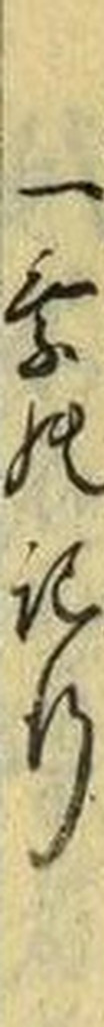一乗の紀行
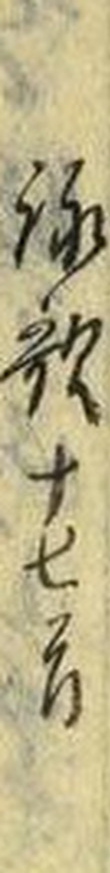詠歌十七首
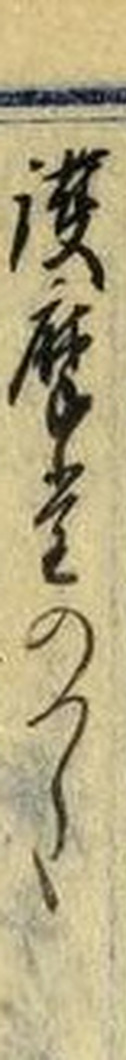護摩堂のつた
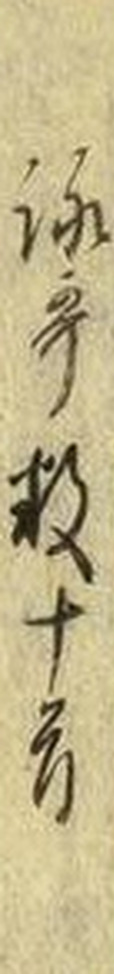詠歌数十種
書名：温古集 三巻
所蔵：福井県文書館 Fukui Prefectural Archives
